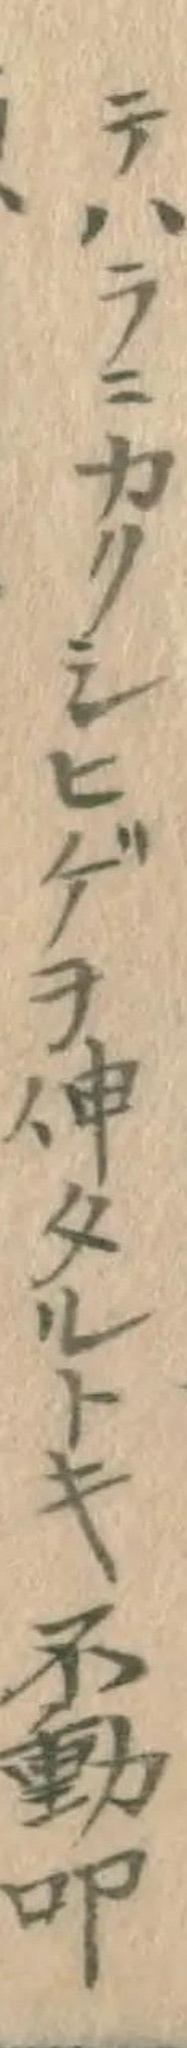テハラニカクシヒゲヲ伸タルトキ不動叩
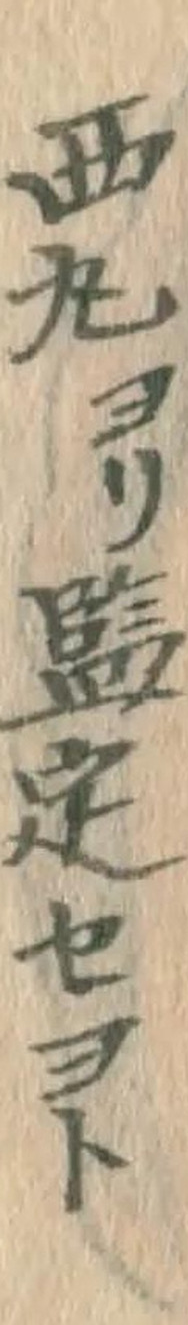西丸ヨリ監定セヨト
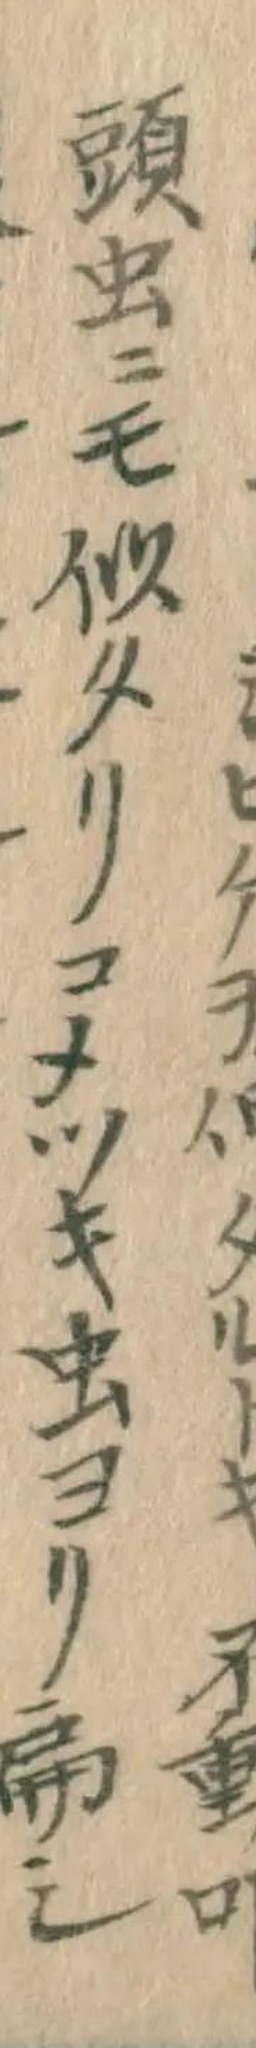頭虫ニモ似タリコメツキ虫ヨリ扁シ
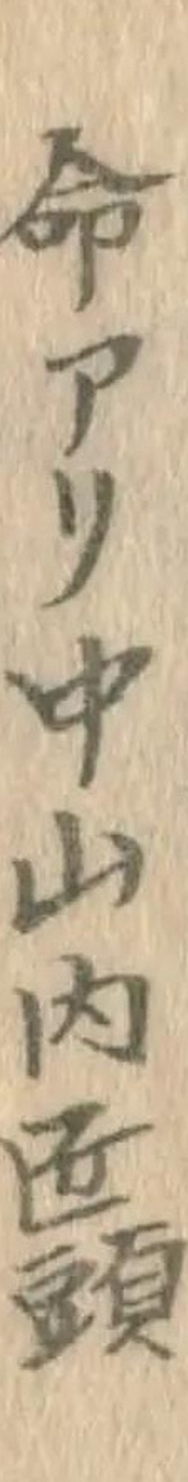命アリ中山内匠頭
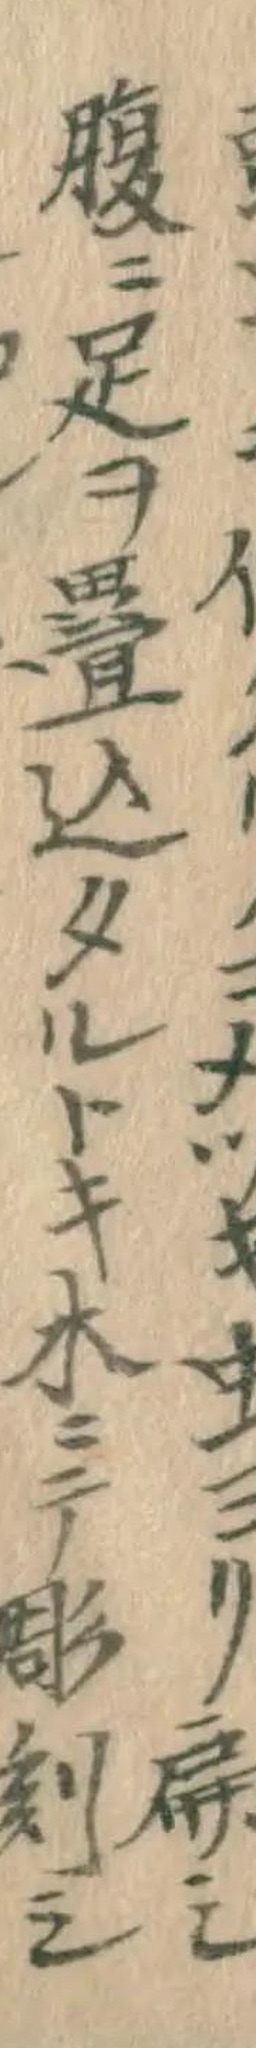腹ニ足ヲ疂込タルトキ木ニテ彫刻シ
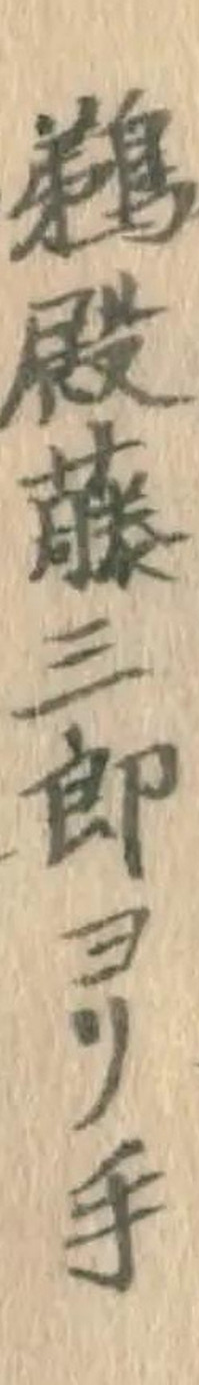鵜殿藤三郎ヨリ手
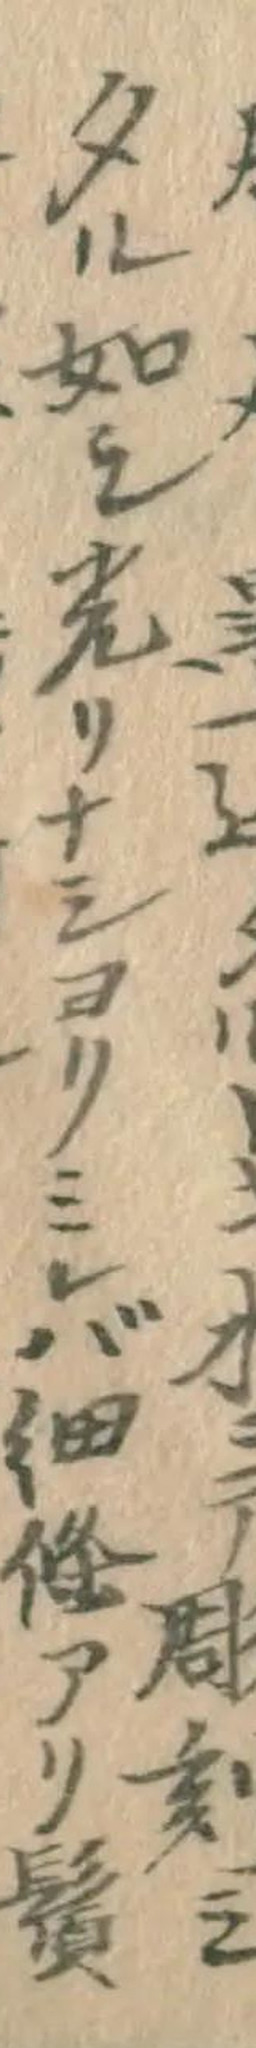タル如シ光リナシヨクミレバ細條アリ鬚
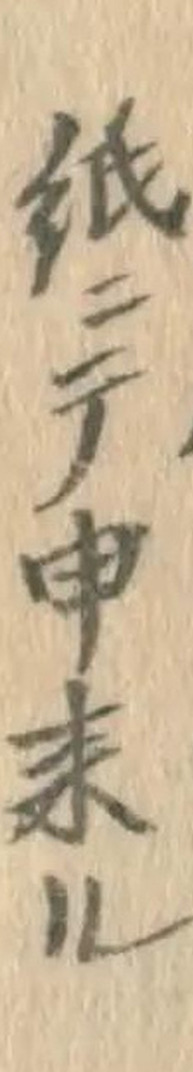紙ニテ申来ル
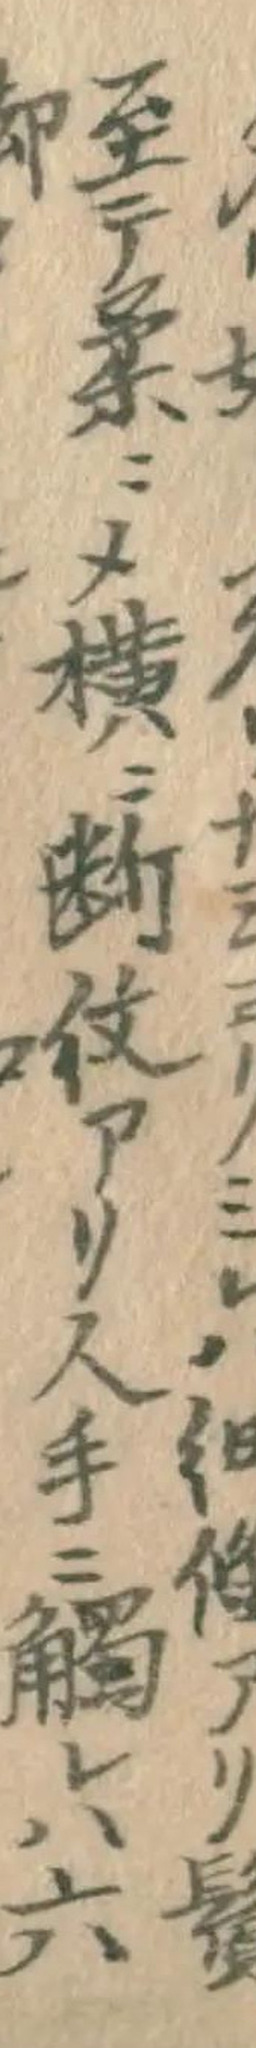至テ柔ニシテ横ニ断紋アリ人手ニ觸レハ六
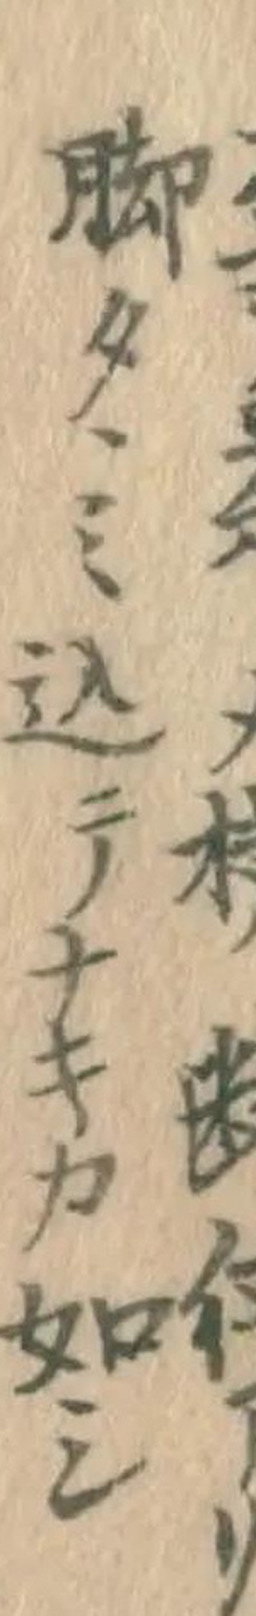脚タヽミ込テナキカ如シ

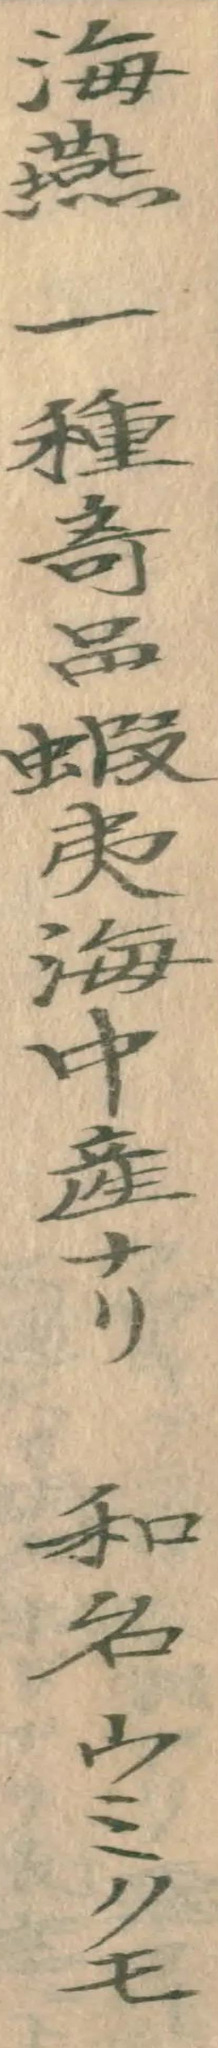海燕一種奇品蝦夷海中産ナリ和名ウミクモ

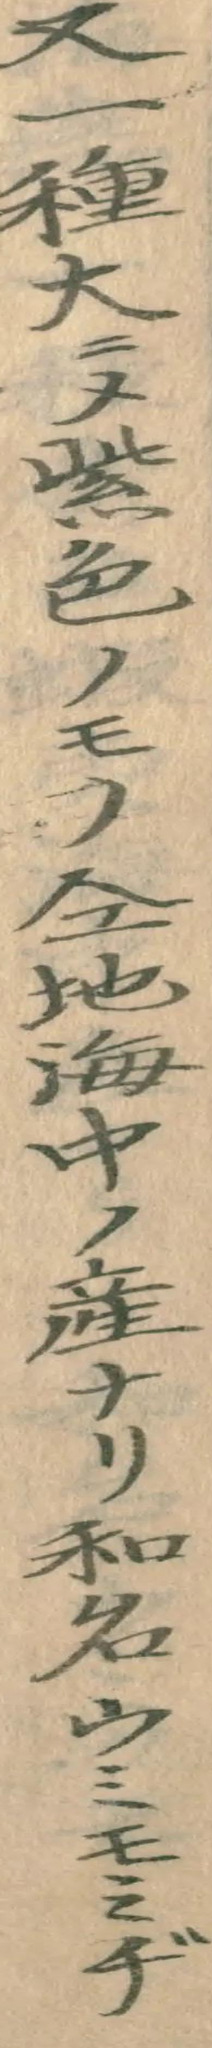又一種大ニシテ紫色ノモノ仝地海中ノ産ナリ和名ウミモミヂ
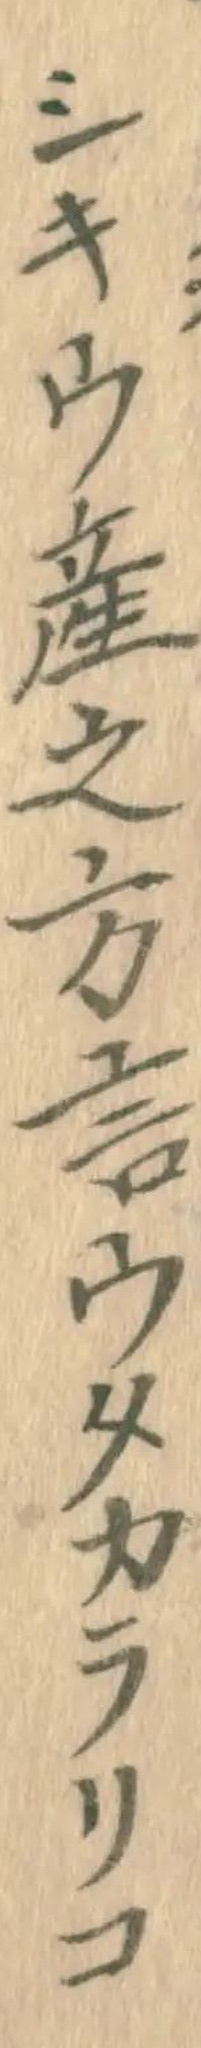シキウ産之方言ウタカラリコ

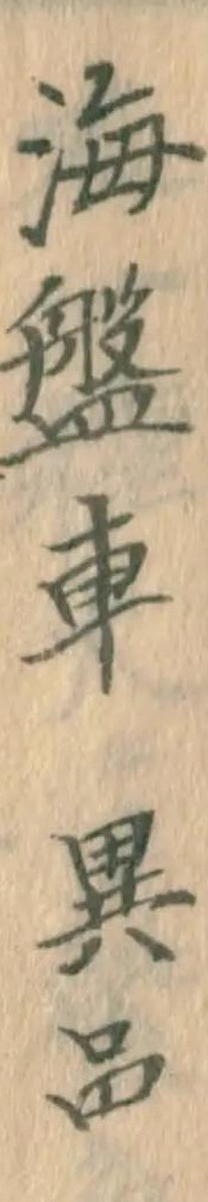海盤車異品
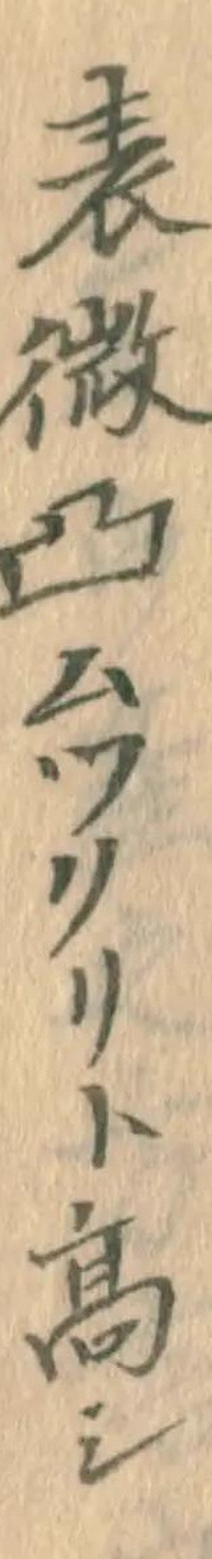表微凸ムツクリト高シ
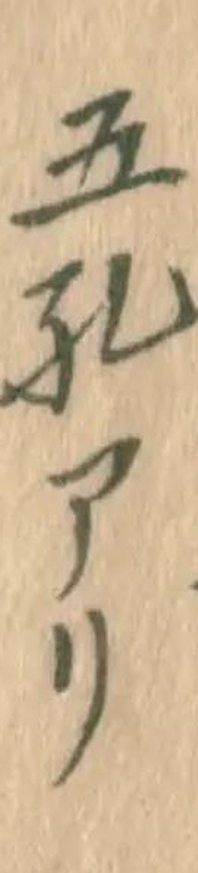五孔アリ
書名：千蟲譜 3巻. [1]
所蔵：国立国会図書館 National Diet Library, JAPAN
